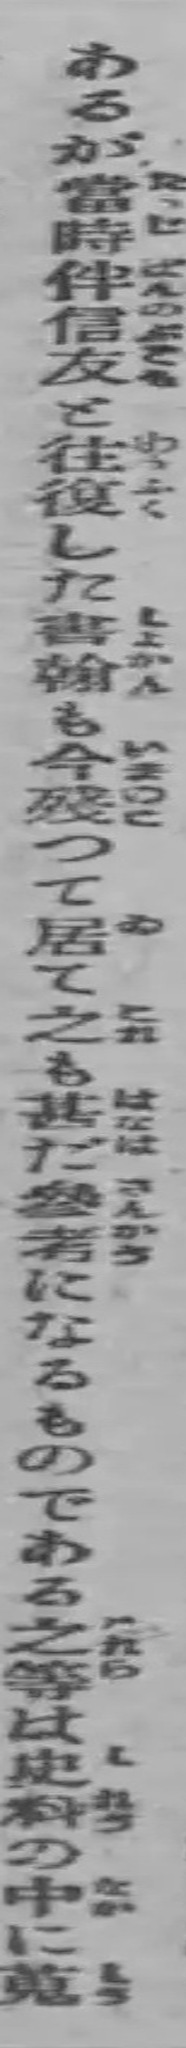あるが当時伴信友と往復した書翰も今残つて居て之も甚だ参考になるものである之等は史料の中に蒐
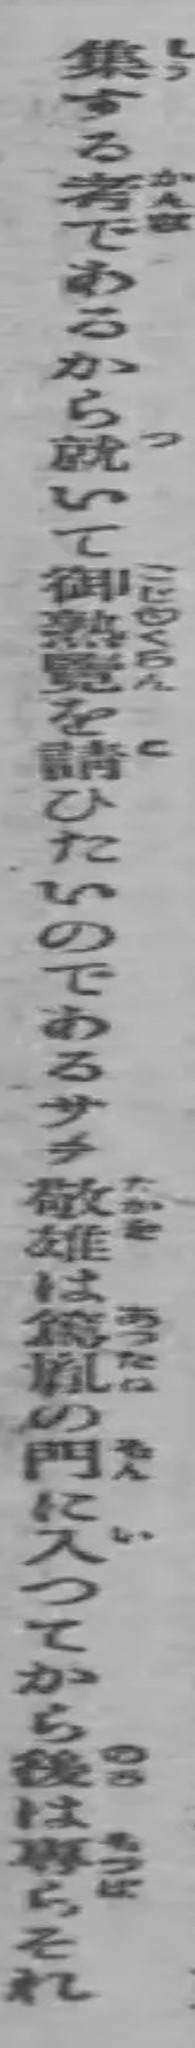集する考であるから就いて御熟覧を請ひたいのであるサテ敬雄は篤胤の門に入つてから後は専らそれ

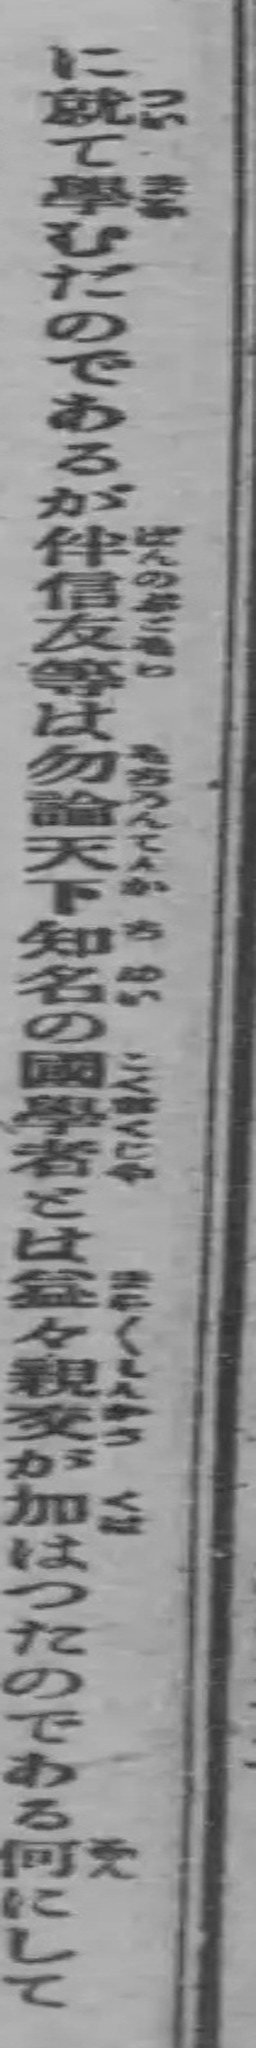に就て学むだのであるが伴信友等は勿論天下知名の国学者とは益々親交が加はつたのである何にして
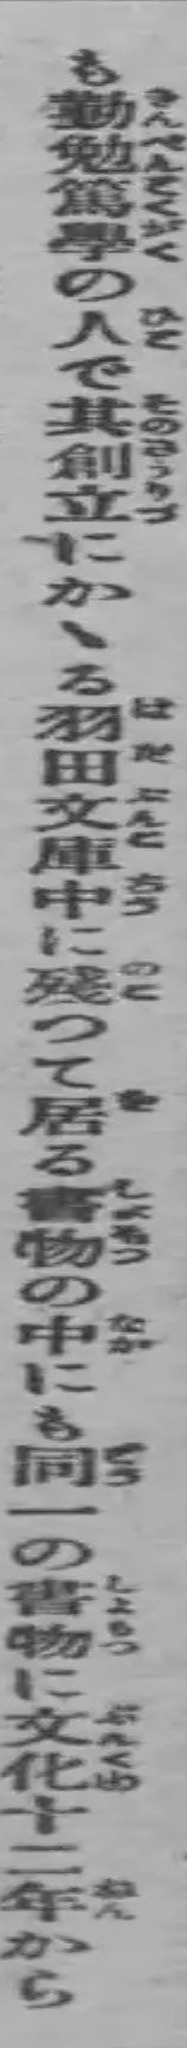も勤勉篤学の人で其創立にかゝる羽田文庫中に残つて居る書物の中にも同一の書物に文化十二年から
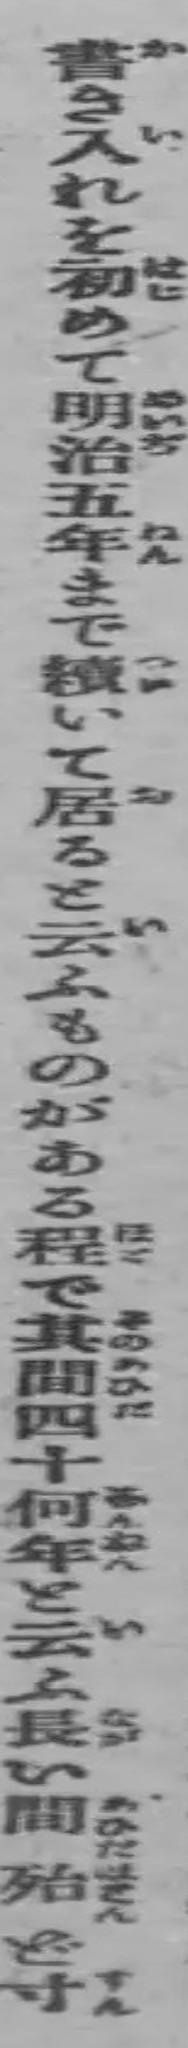書き入れを初めて明治五年まで続いて居ると云ふものがある程で其間四十何年と云ふ長い間殆ど寸
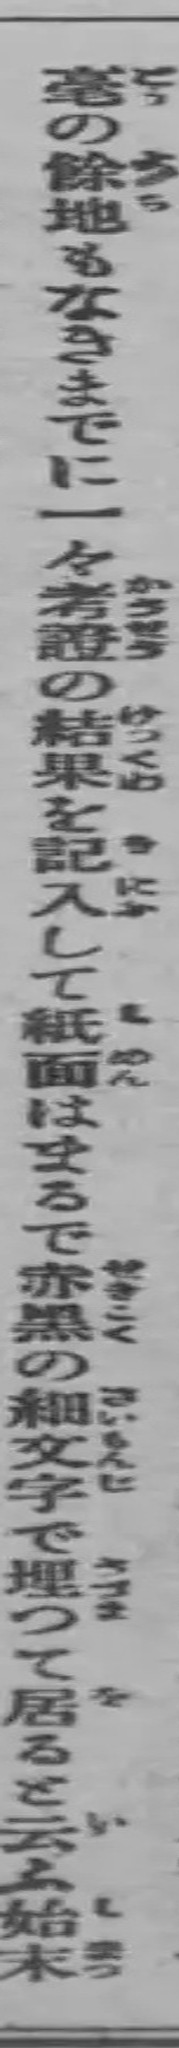毫の余地もなきまでに一々考証の結果を記入して紙面はまるで赤黒の細文字で埋つて居ると云ふ始末
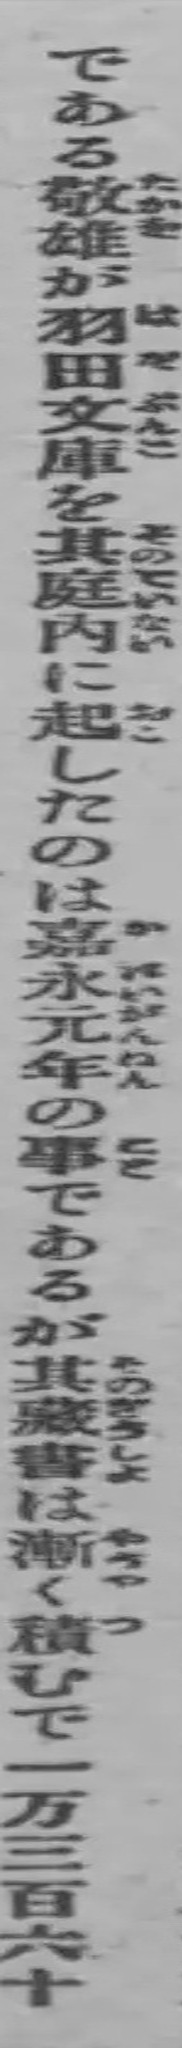である敬雄は羽田文庫を其庭内に起したのは嘉永元年の事であるが其蔵書は漸く積むで一万三百六十
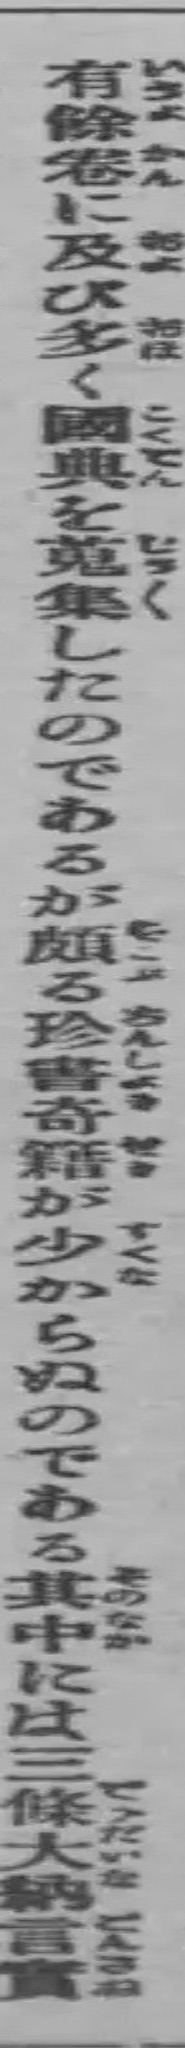有余巻に及び多く国典を蒐集したのであるが頗る珍書奇籍が少からぬのである其中には三条大納言実
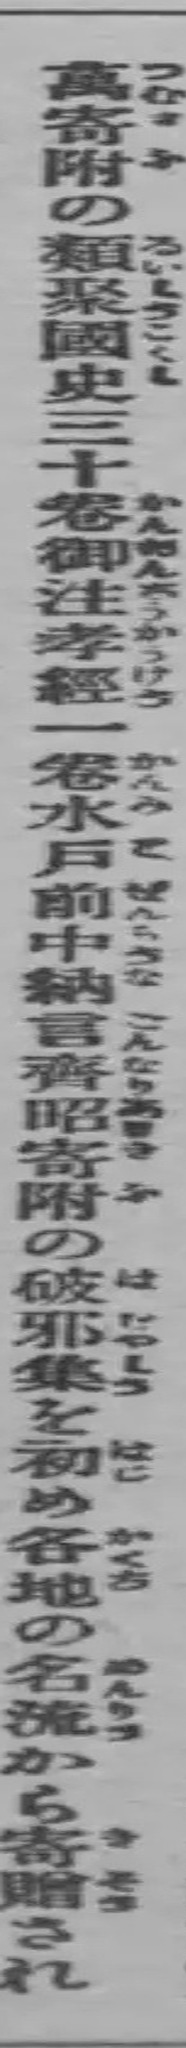萬寄附の類聚国史三十巻御注孝経一巻水戸前中納言斉昭寄附の破邪集を初め各地の名流から寄贈され
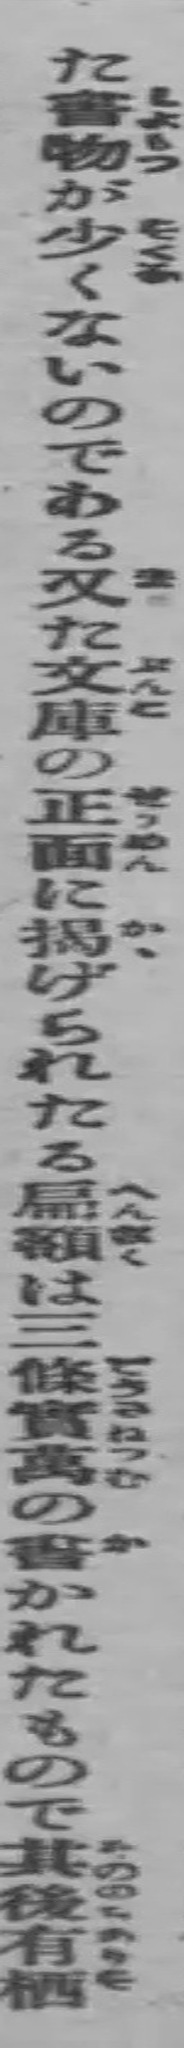た書物が少くないのである又た文庫の正面に掲げられたる扁額は三条実萬の書かれたもので其後有栖
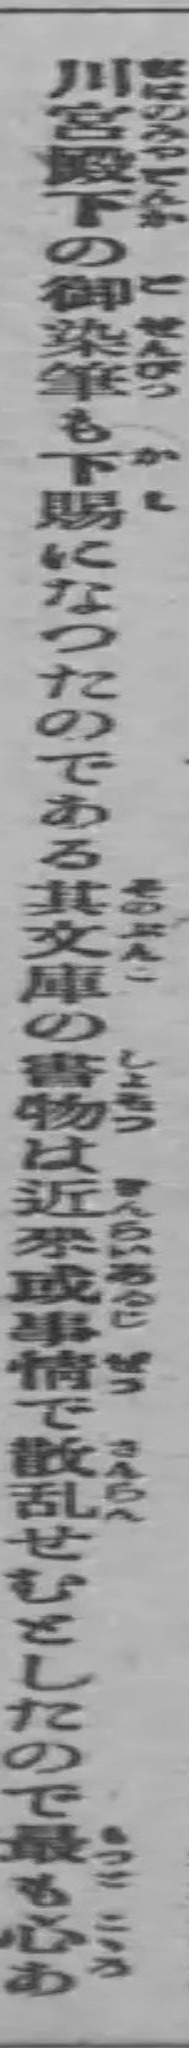川宮殿下の御染筆も下賜になつたのである其文庫の書物は近来或事情で散乱せむとしたので最も心あ
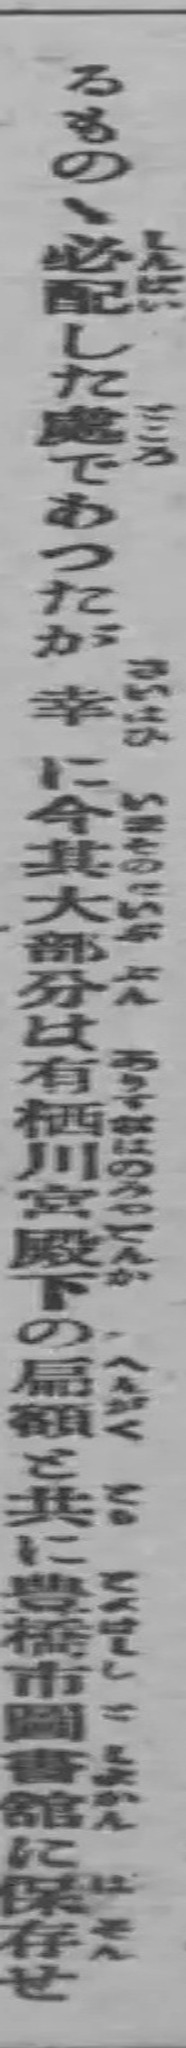るものゝ心配した処であつたが幸に今其大部分は有栖川宮殿下の扁額と共に豊橋市図書館に保存せ
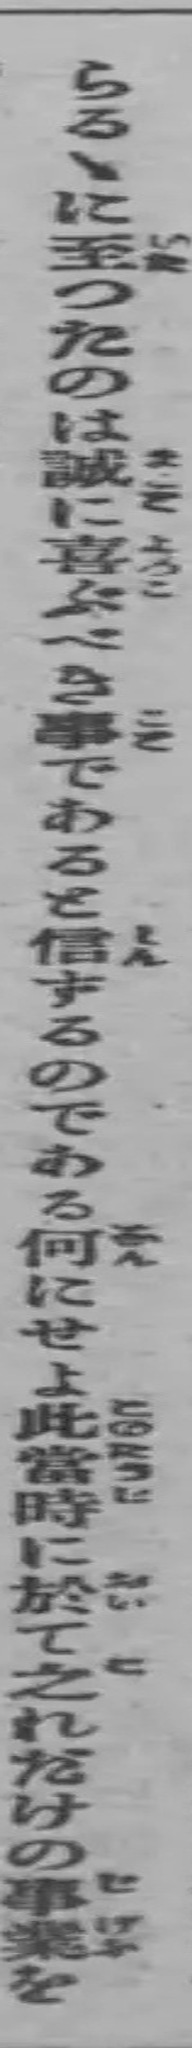らるゝに至つたのは誠に喜ぶべき事であると信ずるのである何にせよ此当時に於て之れだけの事業を
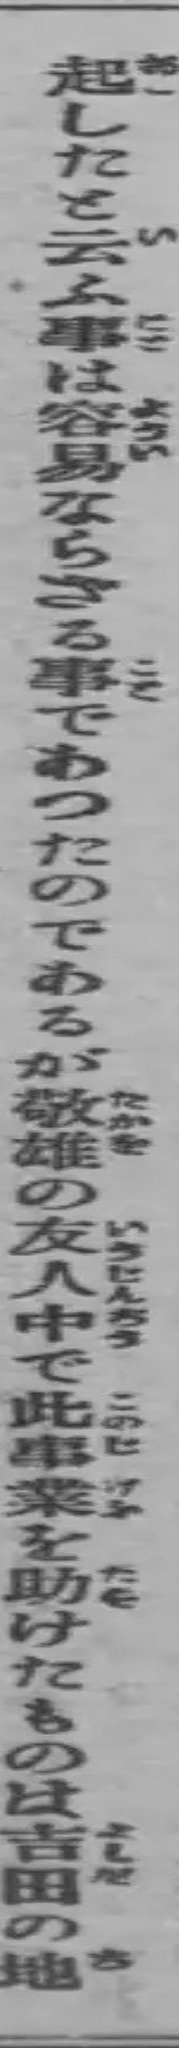起したと云ふ事は容易ならざる事であつたのであるが敬雄の友人中で此事業を助けたものは吉田の地
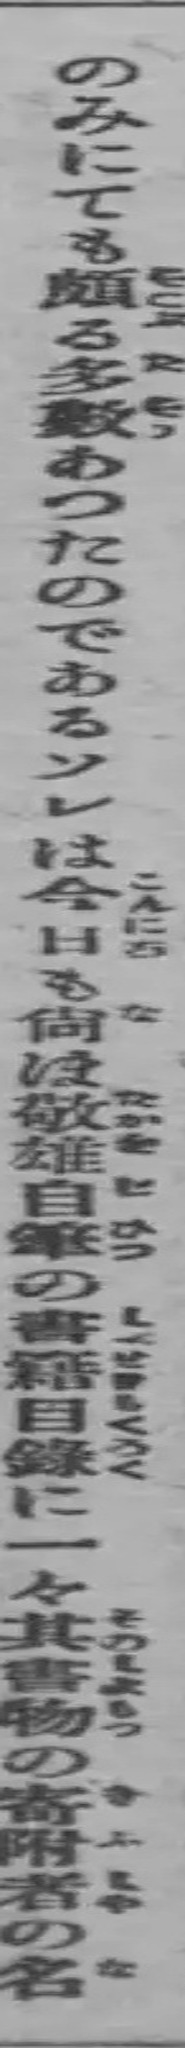のみにても頗る多数あつたのであるソレは今日も尚ほ敬雄自筆の書籍目録に一々其書物の寄附者の名
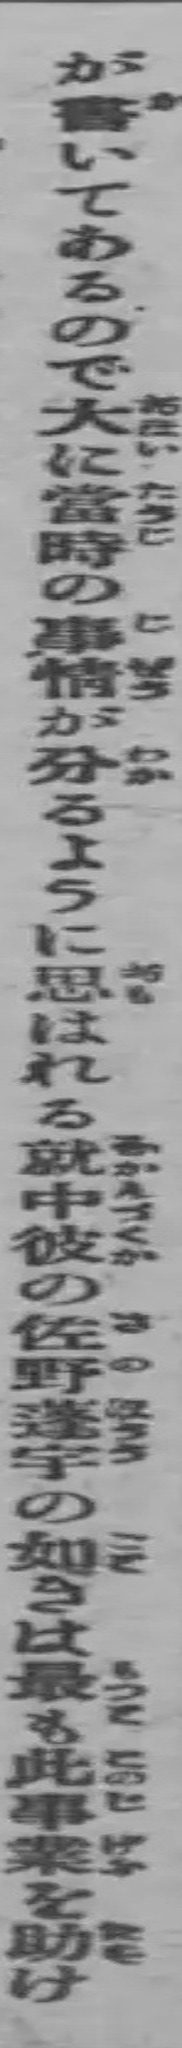が書いてあるので大に当時の事情が分るように思はれる就中彼の佐野蓬宇の如きは最も此事業を助け
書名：豊橋市史談
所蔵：国立国会図書館 National Diet Library, JAPAN
